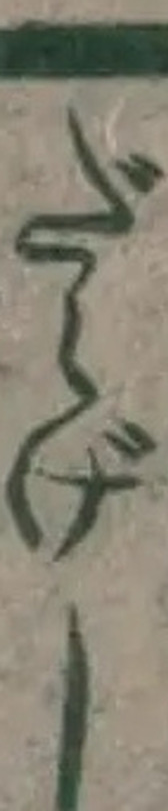だらけ
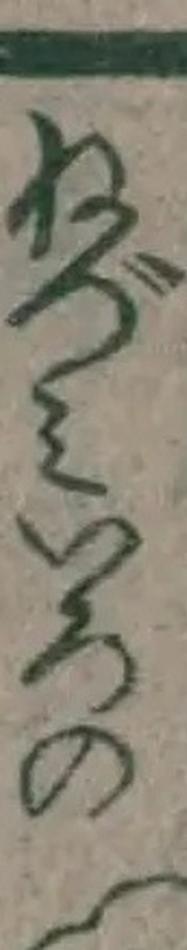ねづみいろの
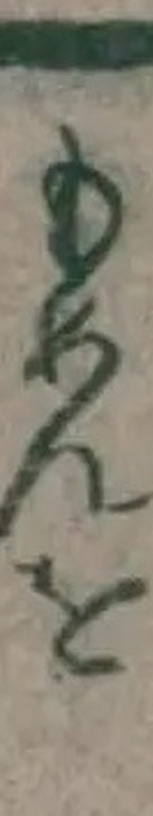もめんを
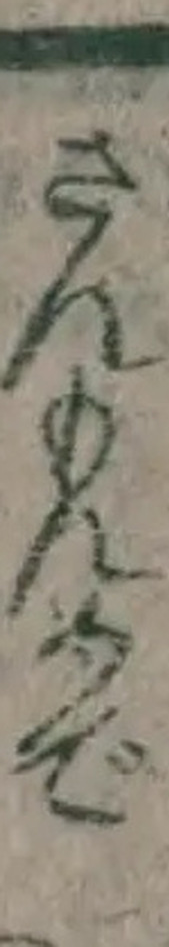さんもんめで
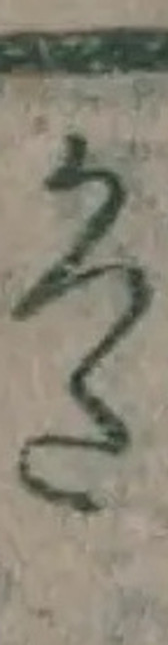かつた
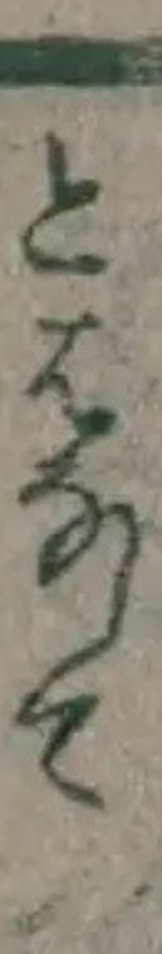とはなして
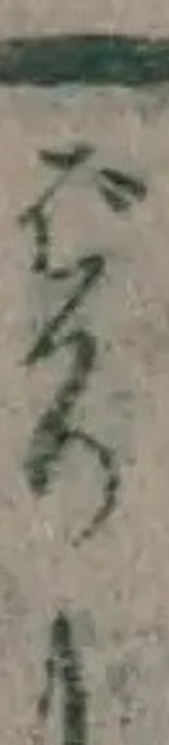ばかり
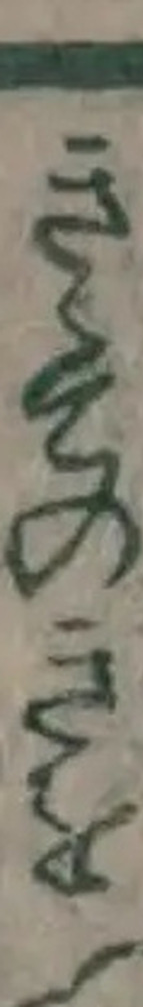きゝてのきを
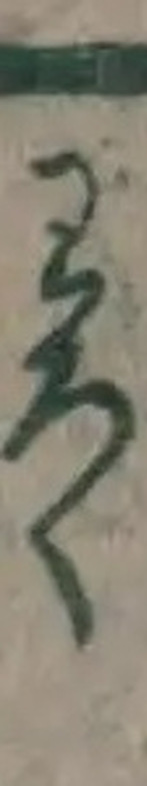わろく
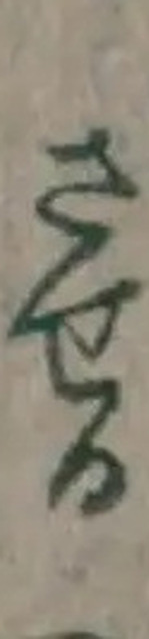させる

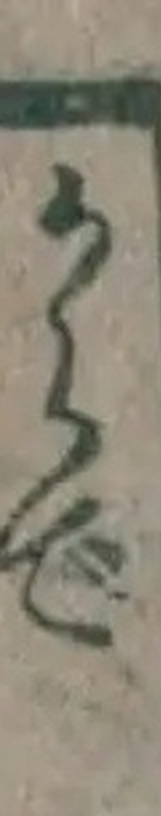からで
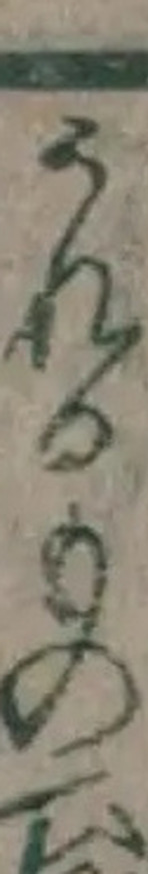うれるもの
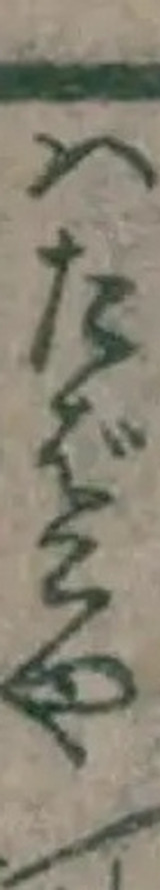はたばこや
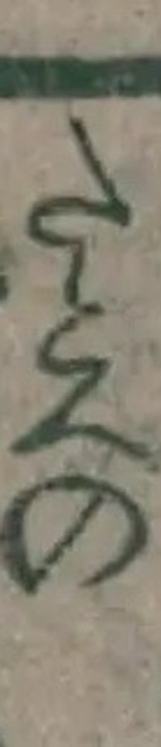たとへの
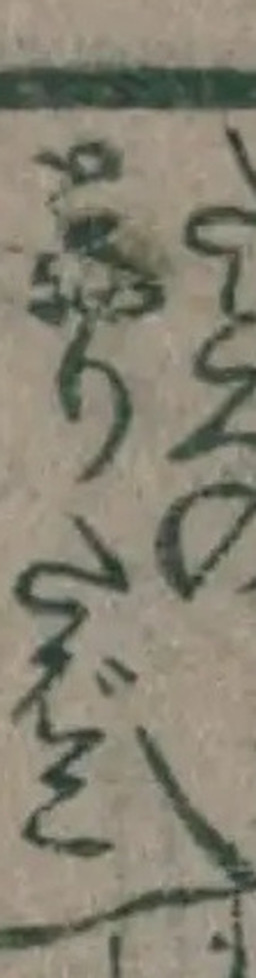とおりたばこ
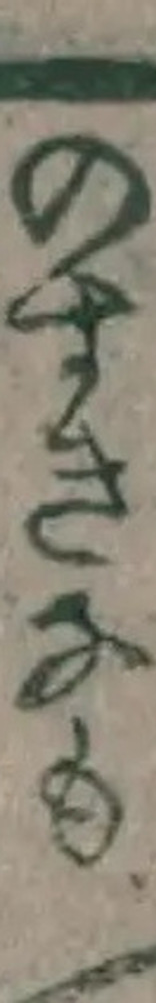のすきなも
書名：縦筒放唐の噺 3巻
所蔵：国立国会図書館 National Diet Library, JAPAN
